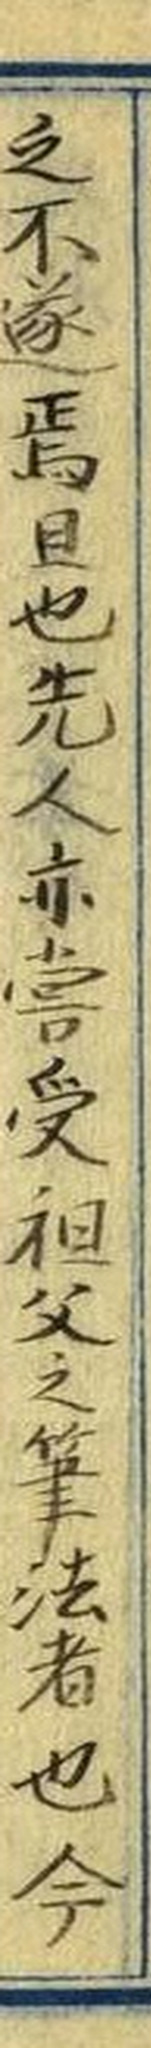之不遂焉且也先人亦嘗受祖父之筆法者也今
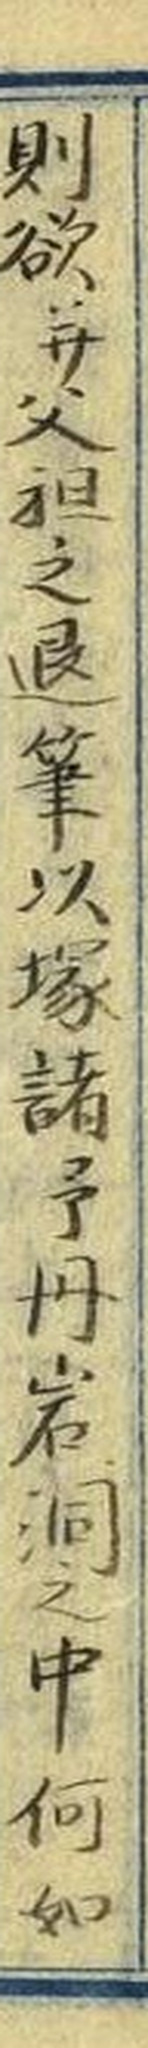則欲并父祖之退筆以塚諸予丹岩洞之中何如
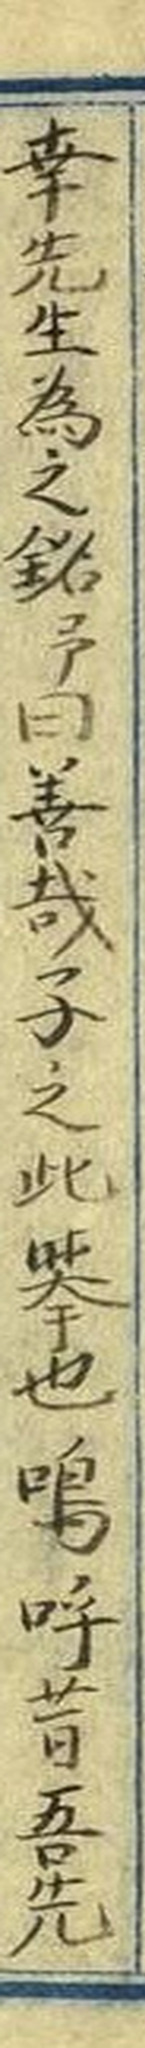幸先生為之銘予曰善哉子之此擧也嗚呼昔吾先
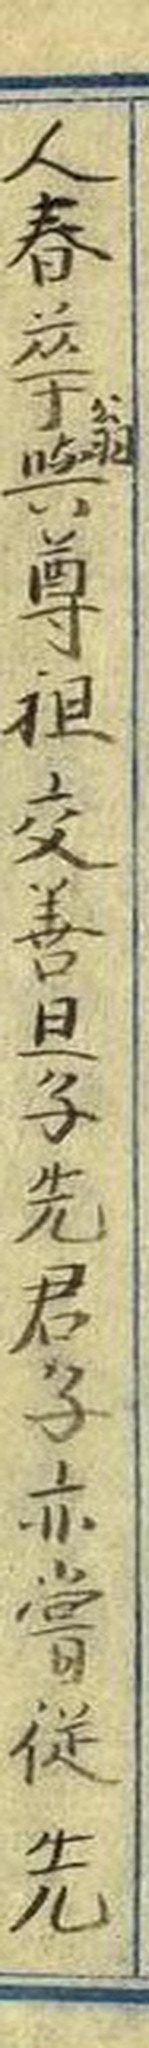人春蕐翁與尊祖交善且子先君子亦嘗従先
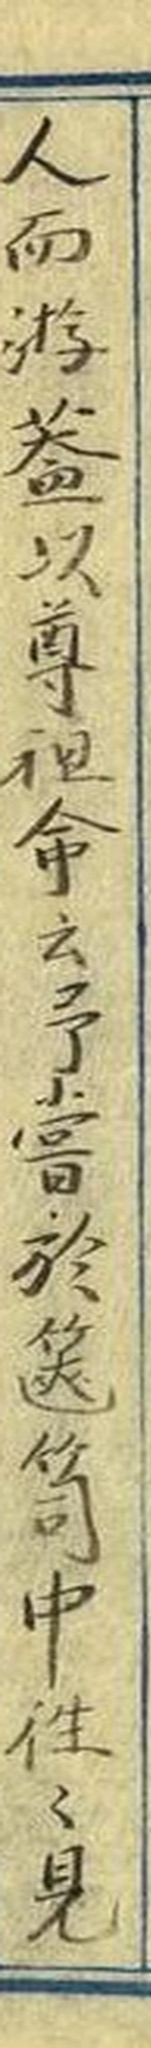人而游蓋以尊祖命云予嘗於篋笥中往々見
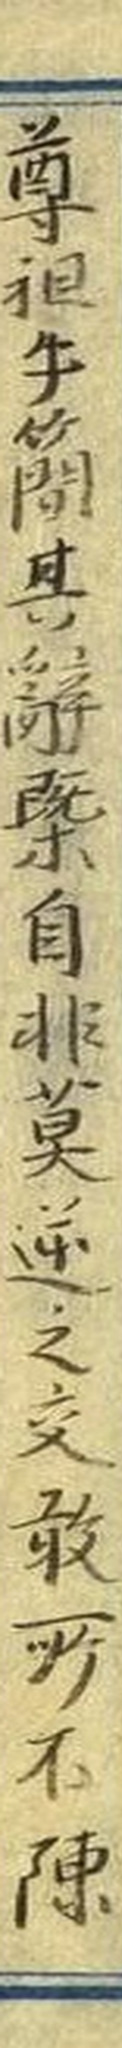尊祖手簡其辭槩自非莫逆之交敢所不陳
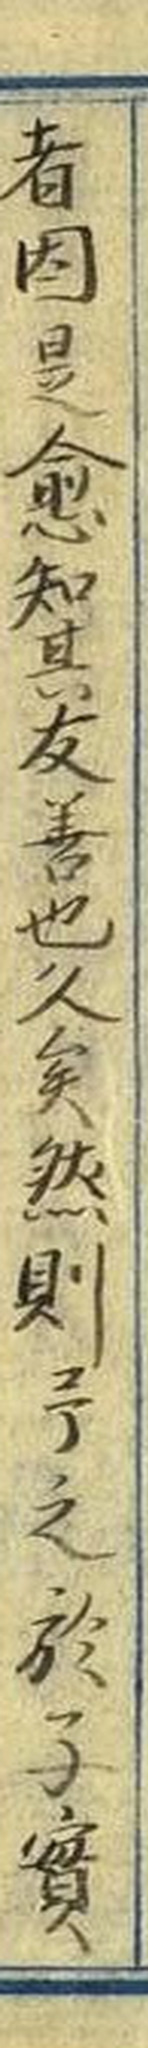者因是愈知其友善也久矣然則予之於子實
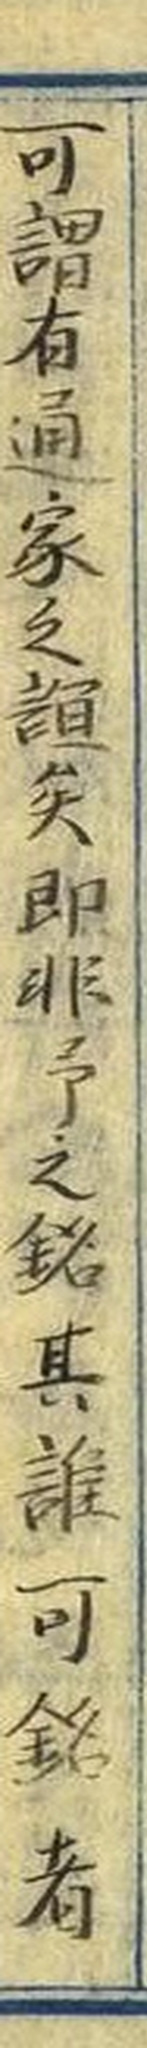可謂有通家之誼矣即非予之銘其誰可銘者
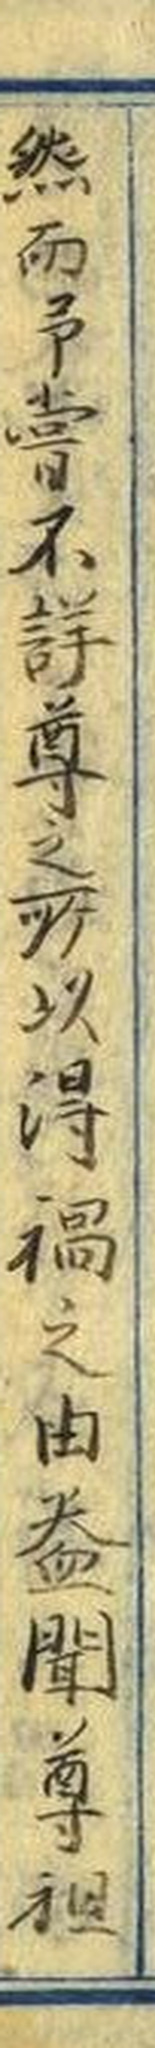然而予嘗不詳尊之所以得禍之由蓋聞尊祖

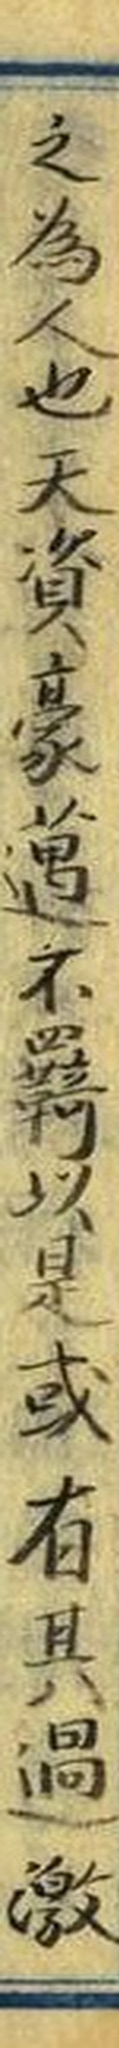之為人也天資豪邁不羇以是或有其過激
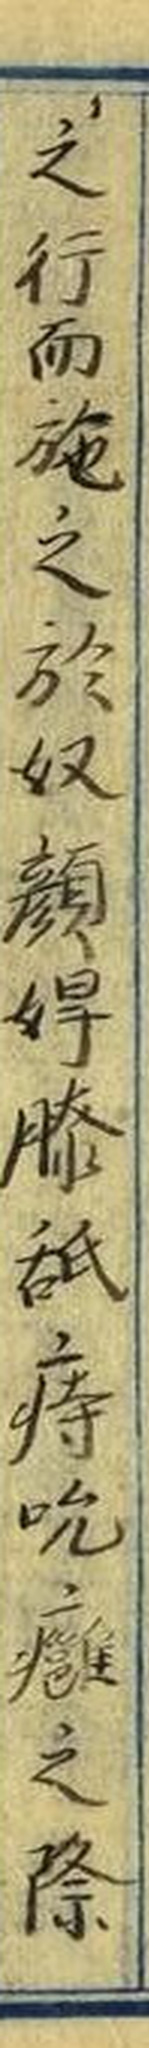之行而施之於奴顔婢膝舐痔吮癰之際
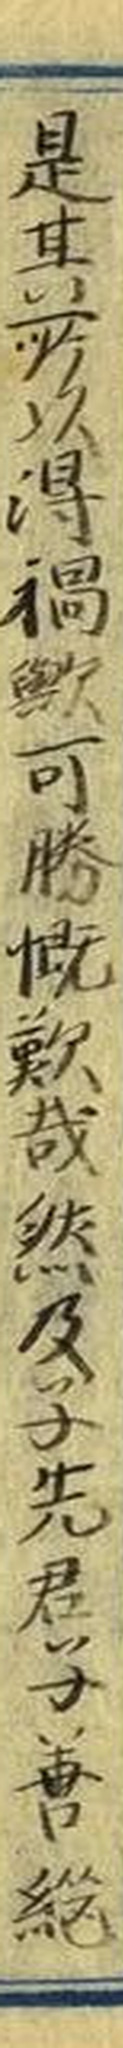是其所以得禍歟可勝慨歎哉然及子先君子善絶
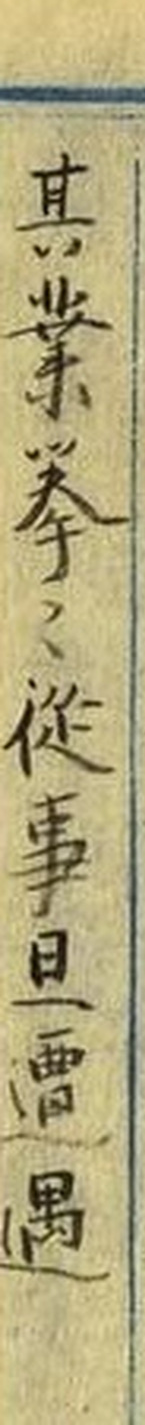其業挙々從事旦遭遇
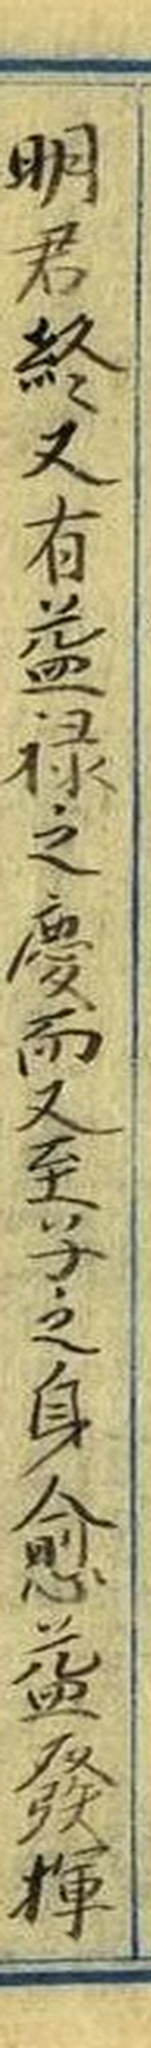明君終又有益禄之慶而又至子之身愈益發揮
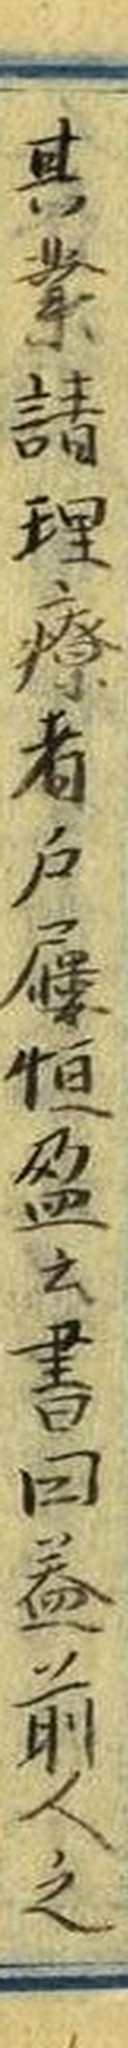其業請理療者戸屨恒盈云書曰益前人之
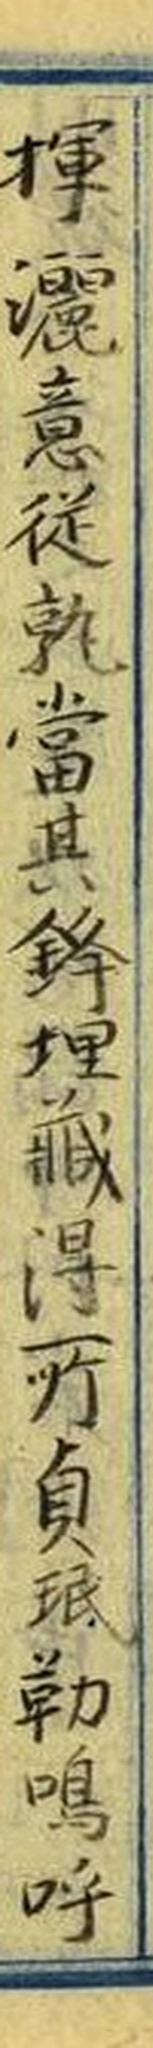揮灑意従孰當其鋒埋藏得所貞珉勒嗚呼
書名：温古集 四巻
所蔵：福井県文書館 Fukui Prefectural Archives
